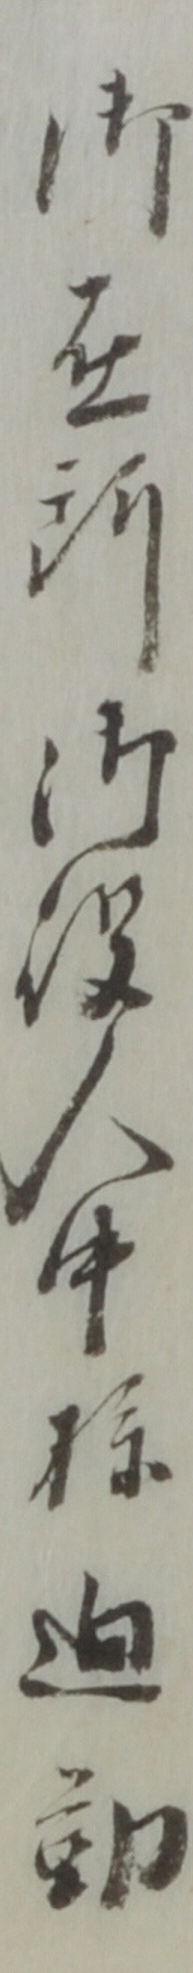御在所御役人中様迫勤
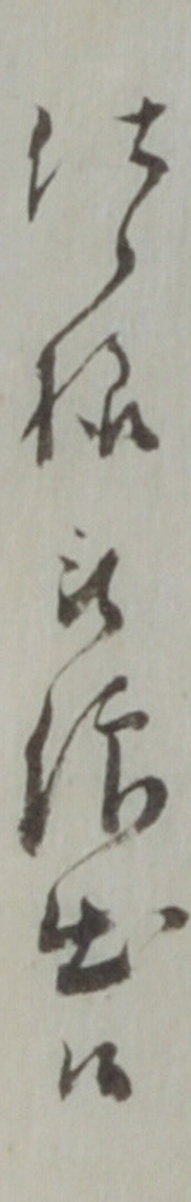仕候様被仰出候

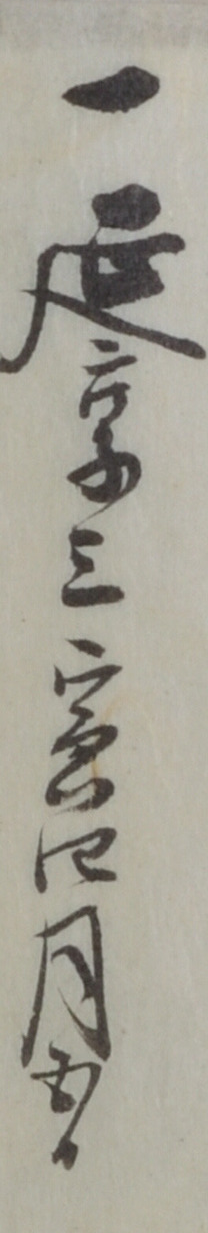一延享三寅四月五日
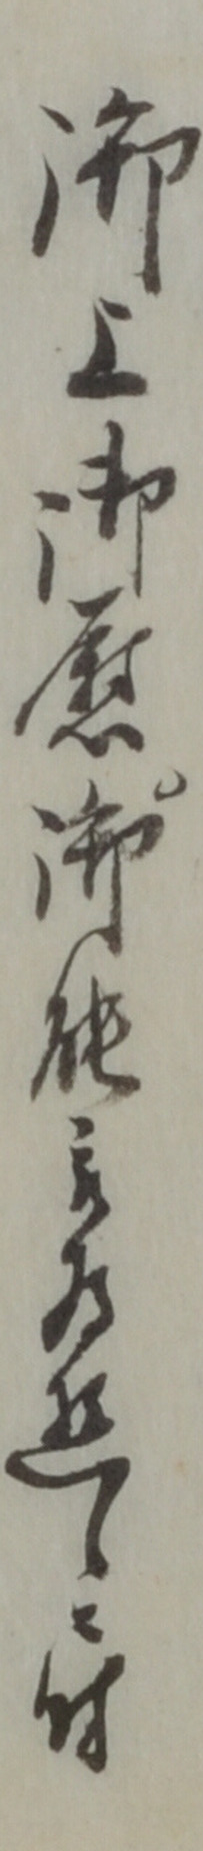御上御慰御能被為遊刻ニ付
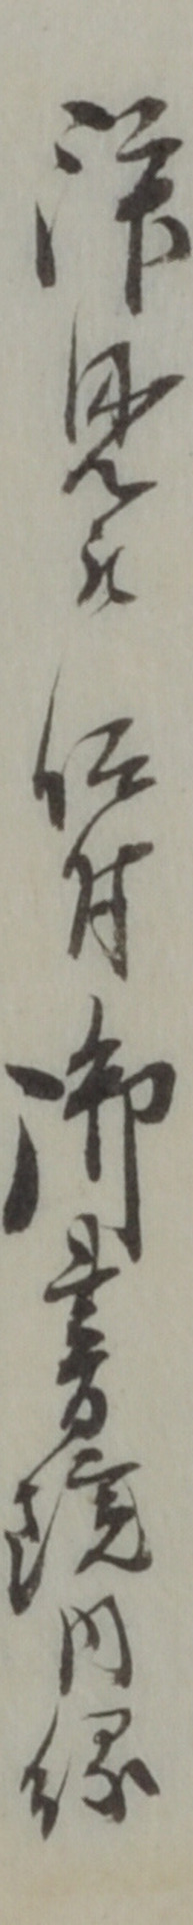拝見被仰付御書院内縁
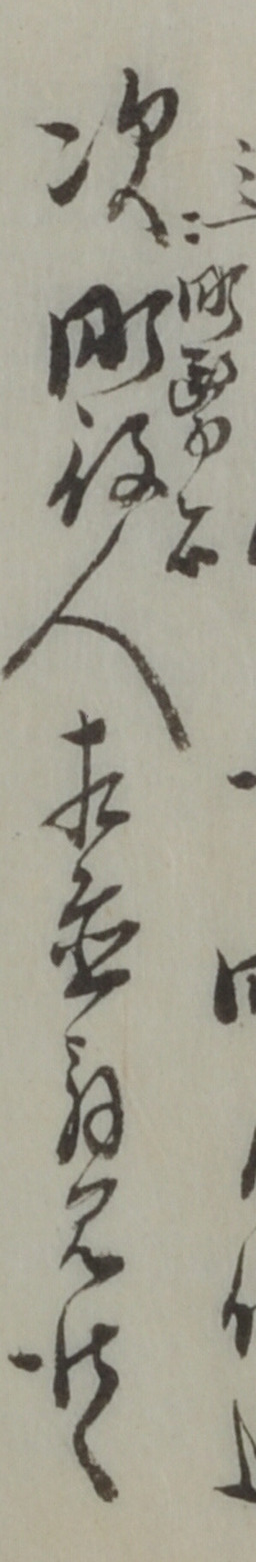継ニ町役人相置拝見仕候
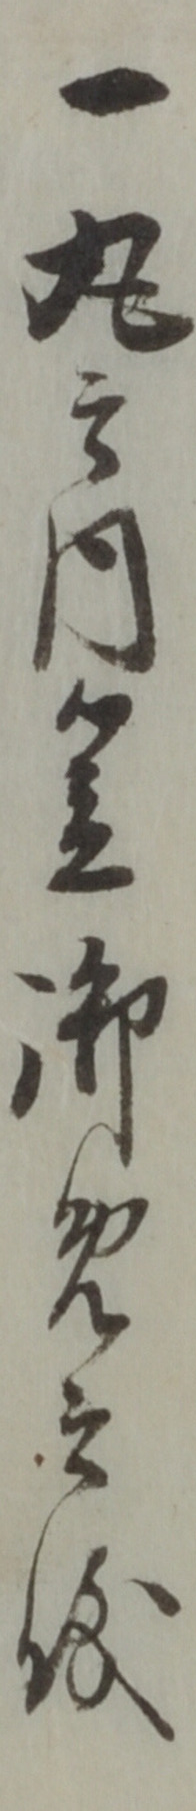一丸之内笠御免之儀
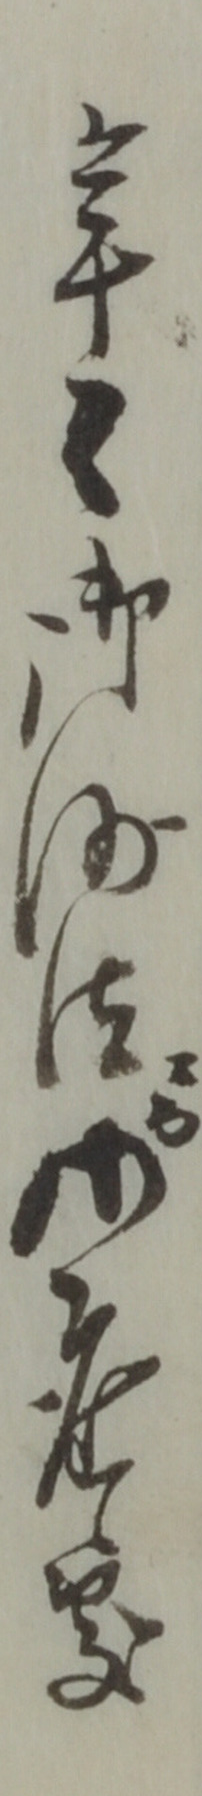年々御沙汰ニ而御座候処
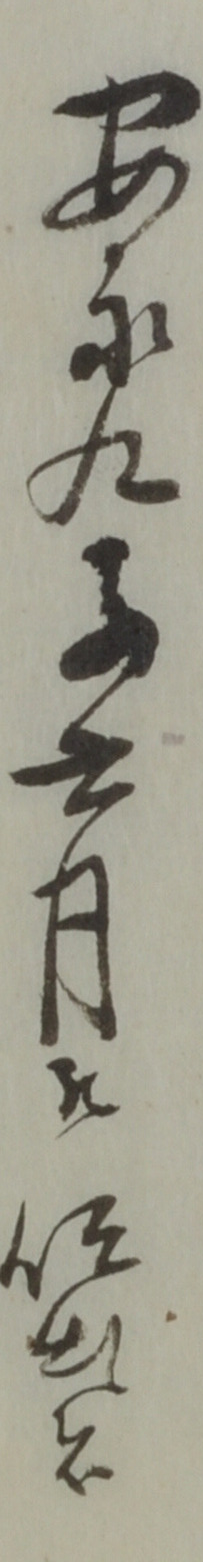安永九子六月被仰出は
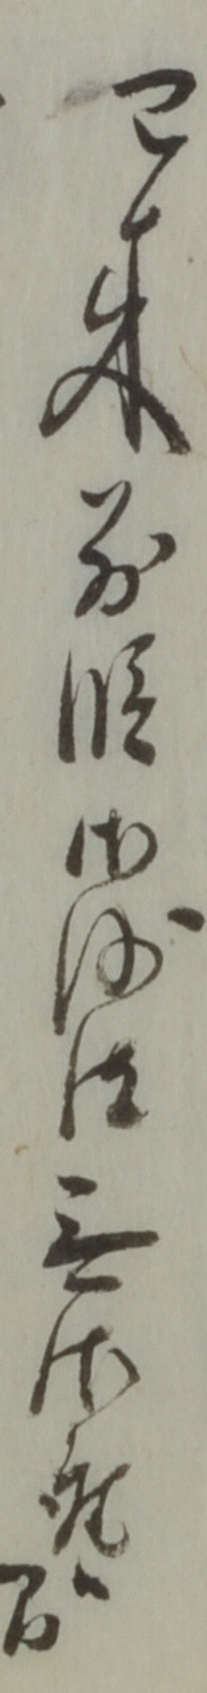已来別段御沙汰無御座候間
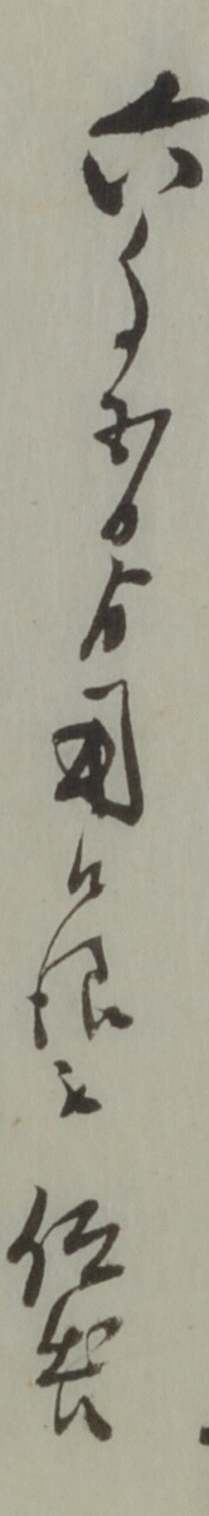六月五日ゟ用候様は仰出候
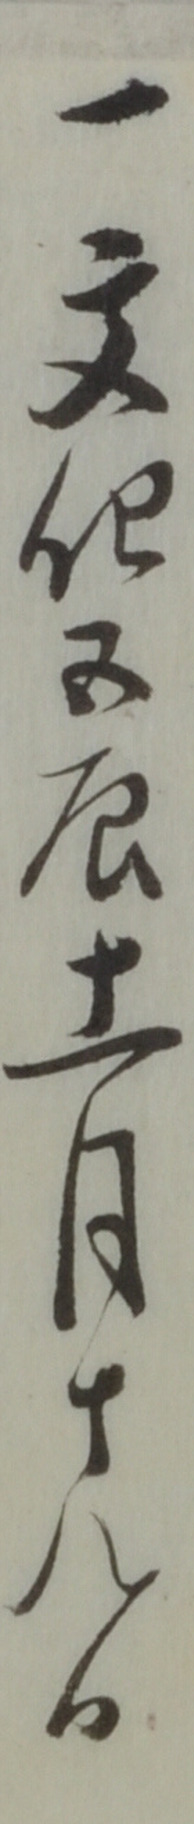一文化五辰十一月十八日
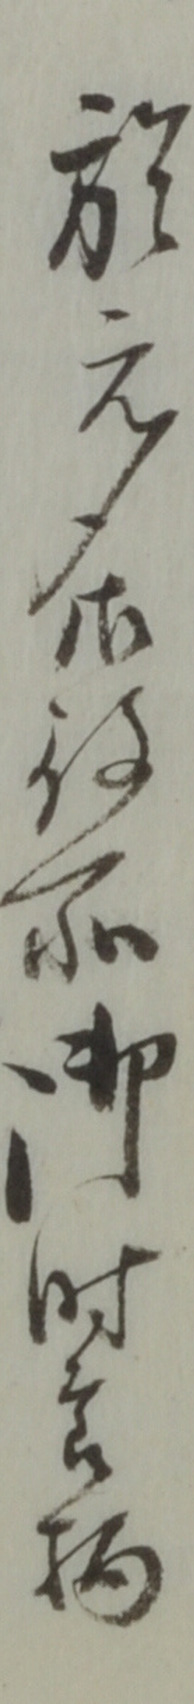於元〆御役所御時節柄
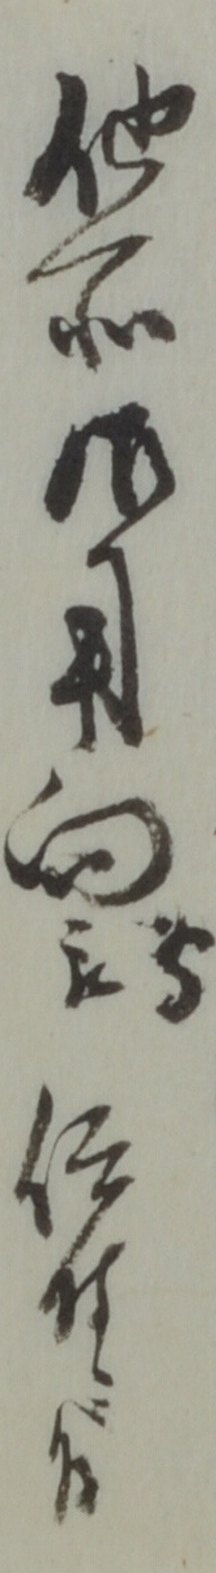他所御用向被仰付ニ付
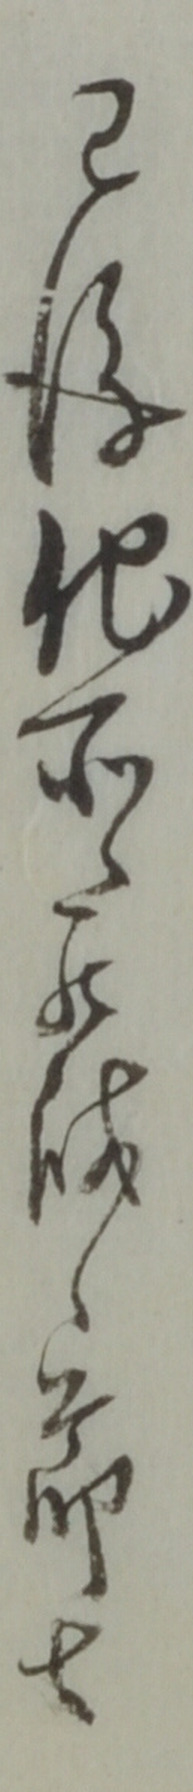已後他所へ罷越候節は
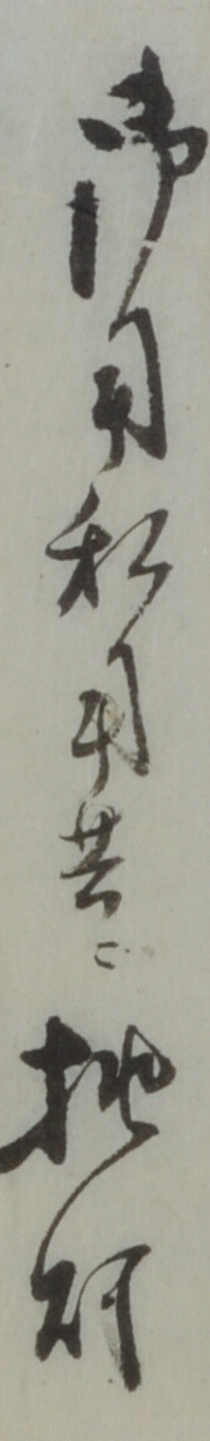御用私用共ニ提灯
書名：抜書
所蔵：伊那市立高遠町図書館・合同会社AMANE
